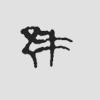隹
